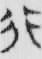行
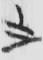之
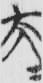大夫
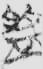盤
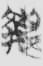執
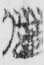○（僕）
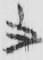之
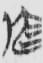倌
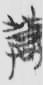登
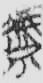虩
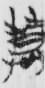登
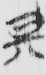○（期）
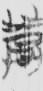登
